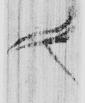民
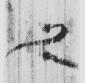氒
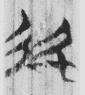𬨠
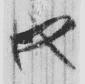女
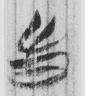{左日}
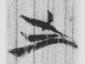之
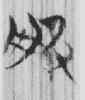服
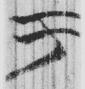于
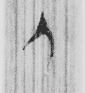人
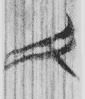民
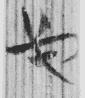弋
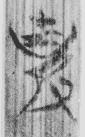尅
